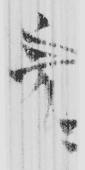先=
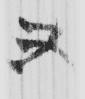又
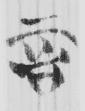言
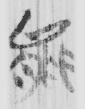能
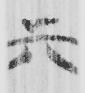亓
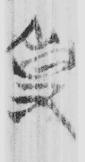事
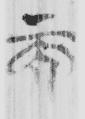而
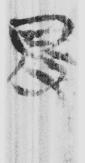𠭁
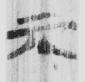亓
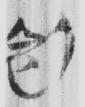飤
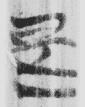是
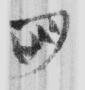名
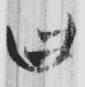曰
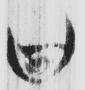昌
